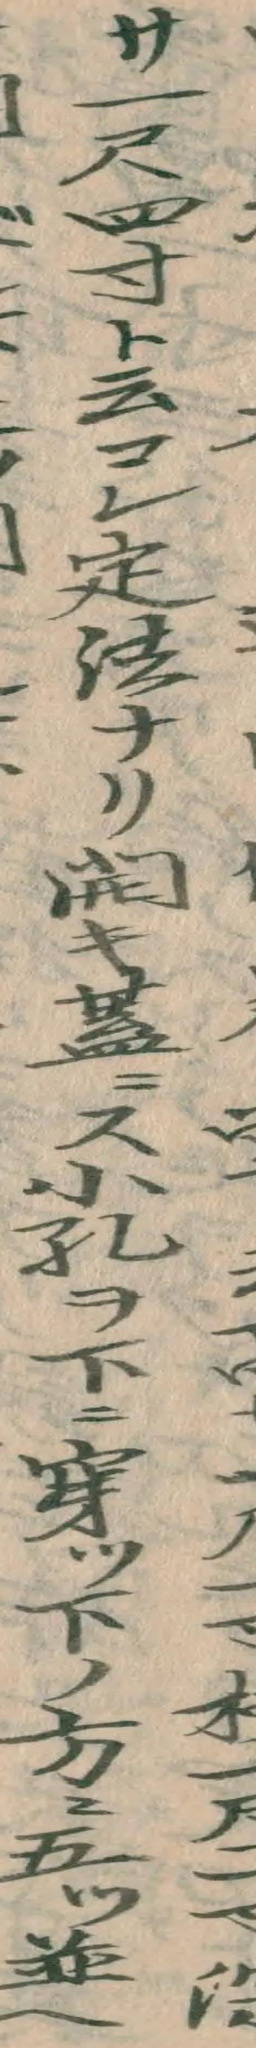サ一尺四寸ト云コレ定法ナリ開キ蓋ニス小孔ヲ下ニ穿ツ下ノ方ニ五ッ並ヘ
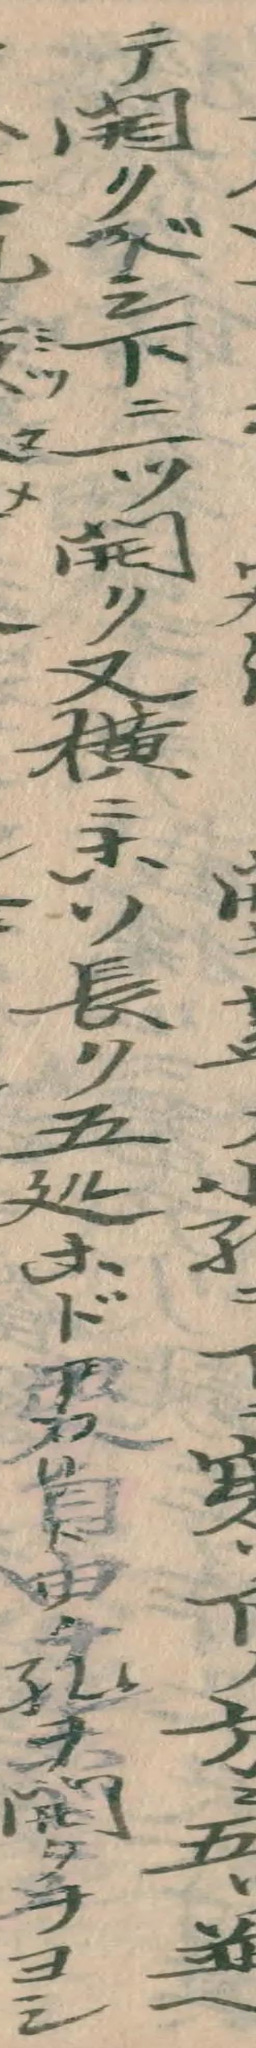テ開クベシ下ニ一ッ開ク又横ニホソ長ク五処ホドアカリトリノ孔ヲ開クヲヨシ
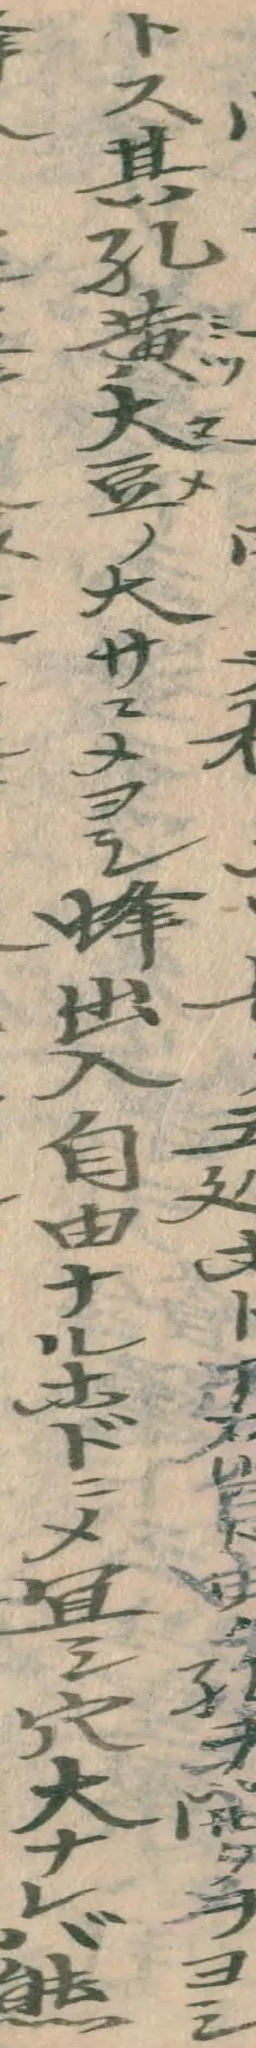トス其孔黄大豆ノ大サニシテヨシ蜂出入自由ナルホドニシテ宜シ穴大ナレバ熊
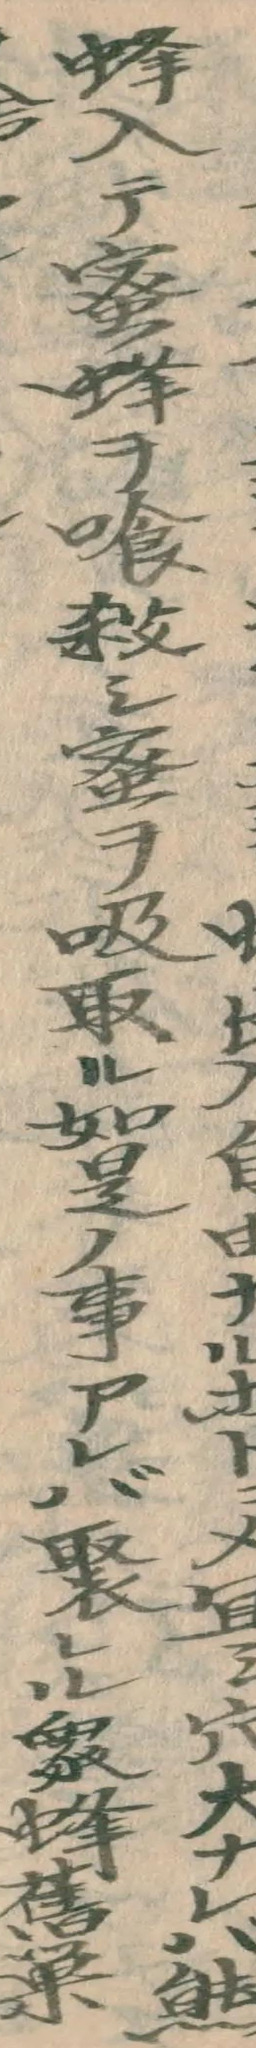蜂入テ蜜蜂ヲ喰殺シ蜜ヲ吸取ル如是ノ事アレバ聚レル衆蜂舊巣
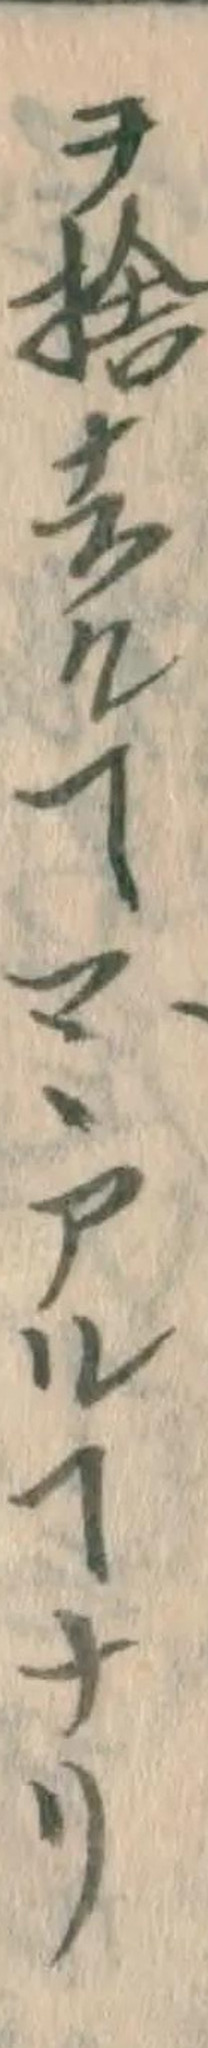ヲ捨去ルコトマヽアルコトナリ
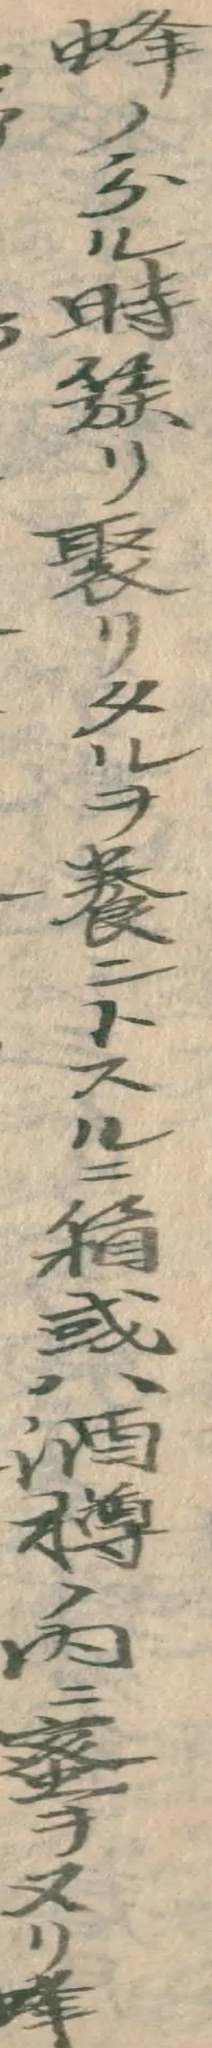蜂ノ分ル時簇リ聚リタルヲ養ントスルニ箱或ハ酒樽ノ内ニ蜜ヲヌリ蜂
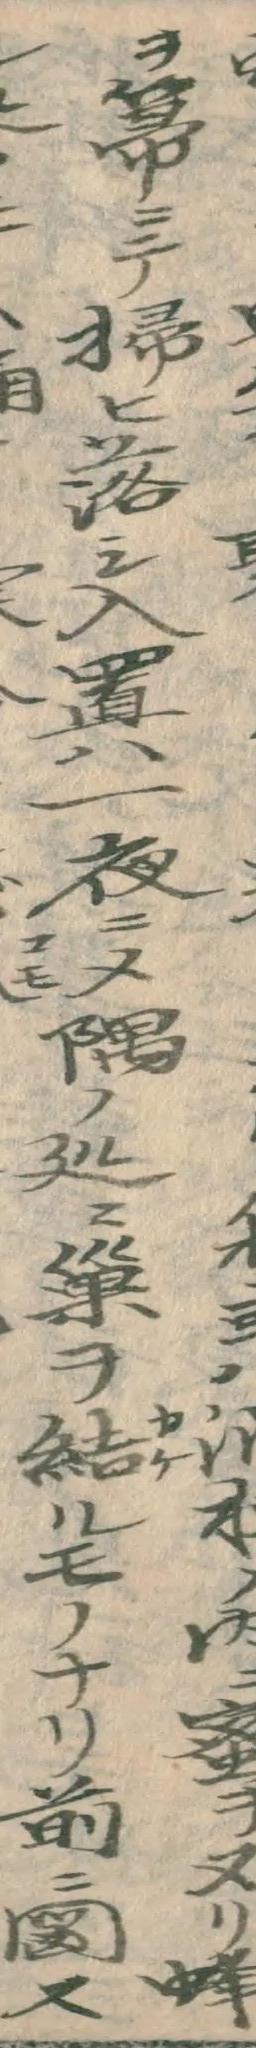ヲ箒ニテ掃ヒ落シ入置ハ一夜ニシテ隅ノ処ニ巣ヲ結ルモノナリ前ニ圖ス
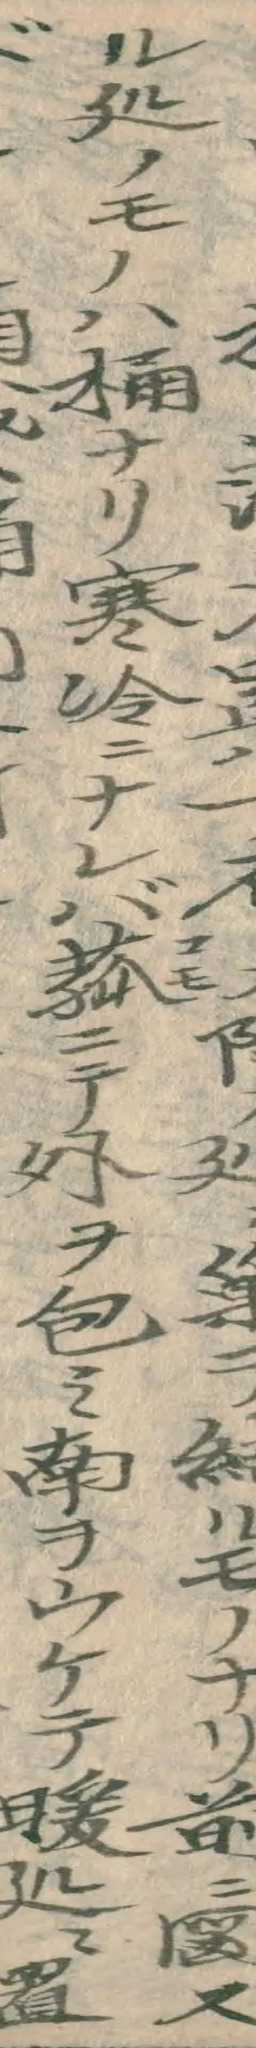ル処ノモノハ桶ナリ寒冷ニナレバ菰ニテ外ヲ包ミ南ヲウケテ暖処ニ置
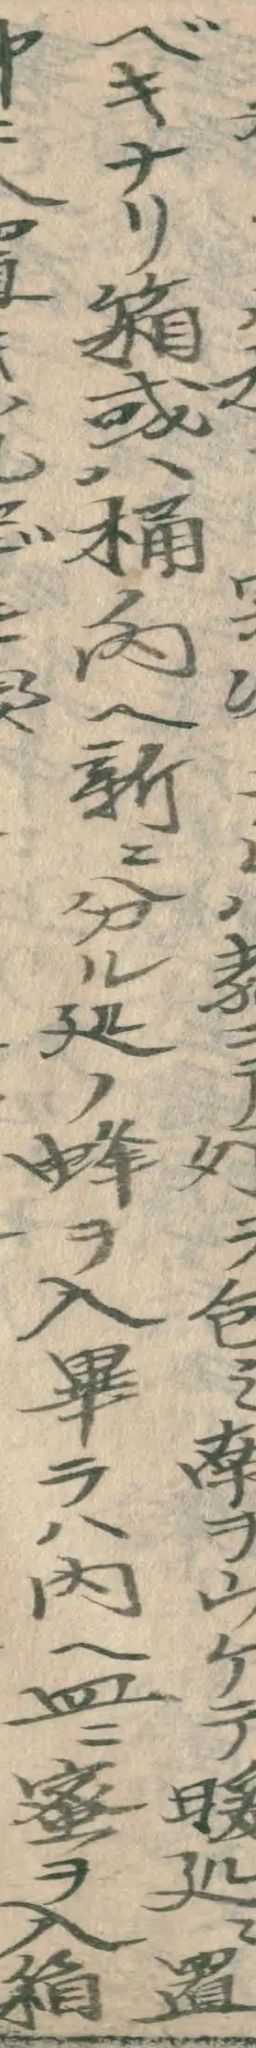ベキナリ箱或ハ桶ノ内ヘ新ニ分ル処ノ蜂ヲ入畢ラハ内ヘ皿ニ蜜ヲ入箱
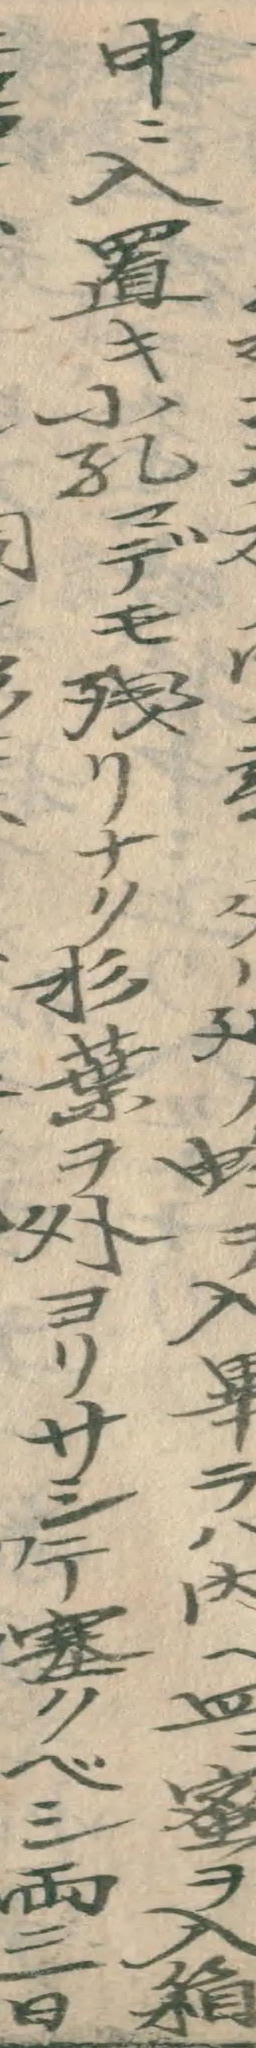中ニ入置キ小孔マデモ残リナク杉葉ヲ外ヨリサシテ塞クベシ両三日
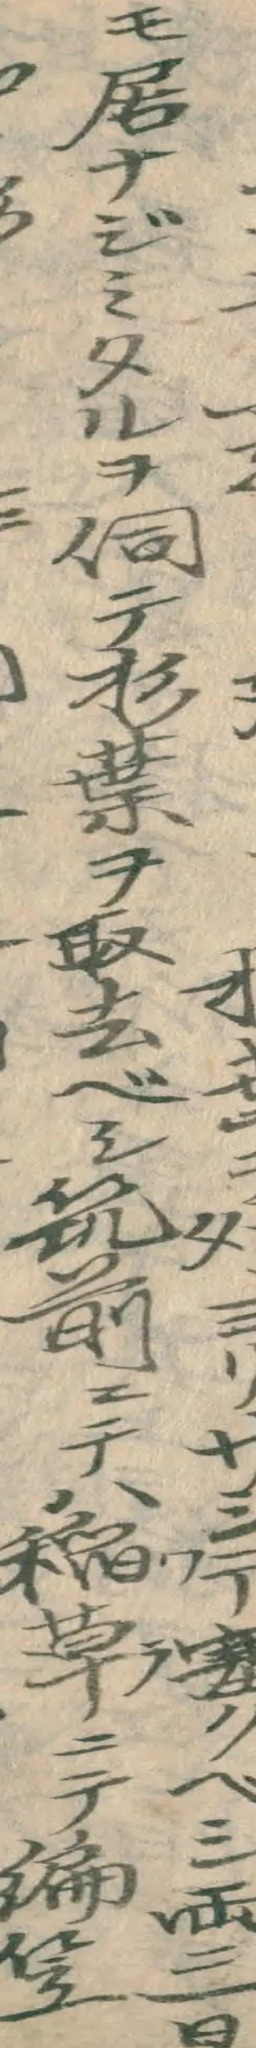モ居ナジミタルヲ伺テ杉葉ヲ取去ベシ筑前ニテハ稲草ニテ編笠
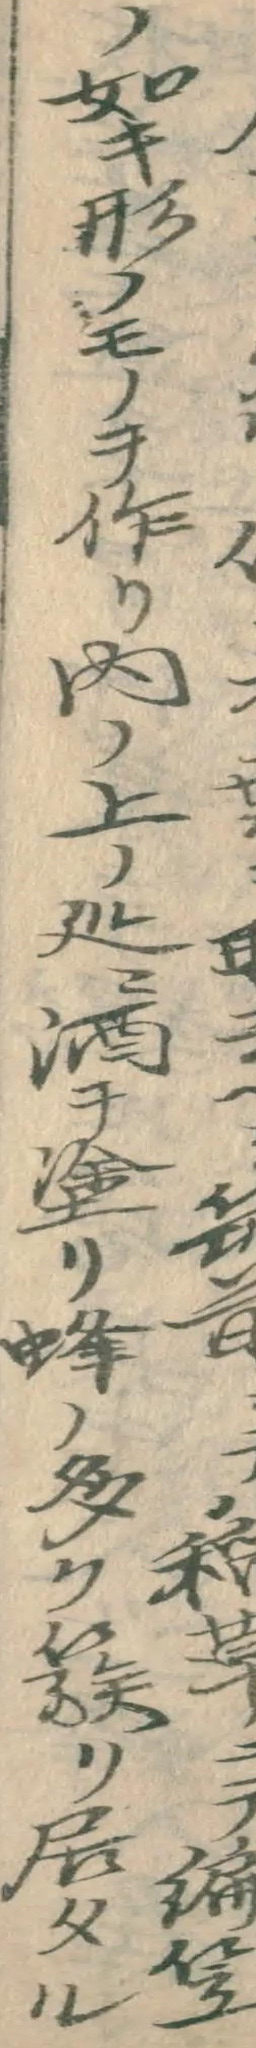ノ如キ形ノモノヲ作リ内ノ上ノ処ニ酒ヲ塗リ蜂ノ多ク簇リ居タル

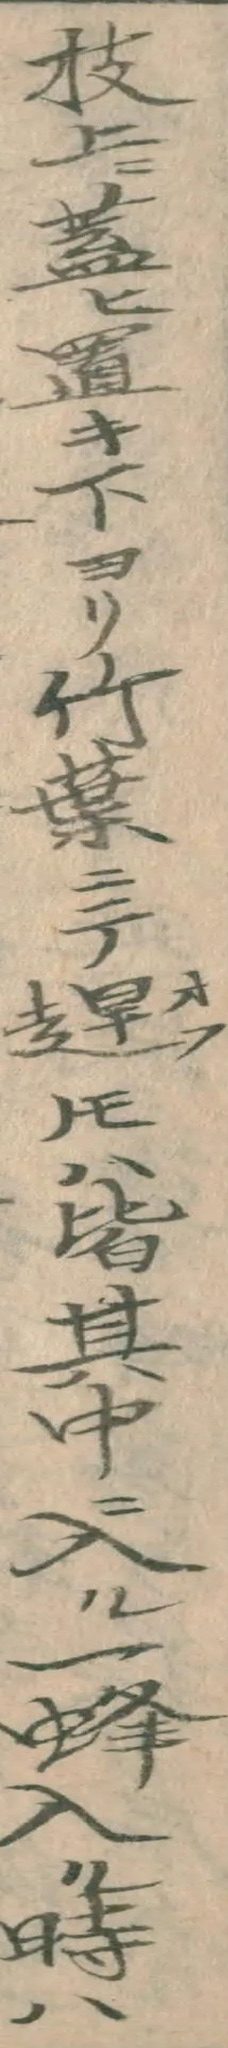枝上ニ蓋ヒ置キ下ヨリ竹葉ニテ趕トモハ皆其中ニ入ル一蜂入ル時ハ
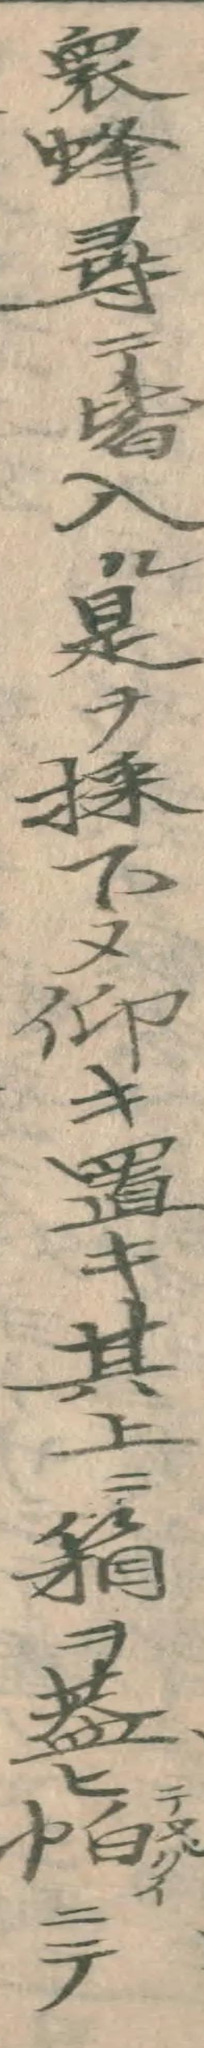衆蜂尋テ皆入ル是ヲ採下シテ仰キ置キ其上ニ箱ヲ蓋ヒ帕ニテ
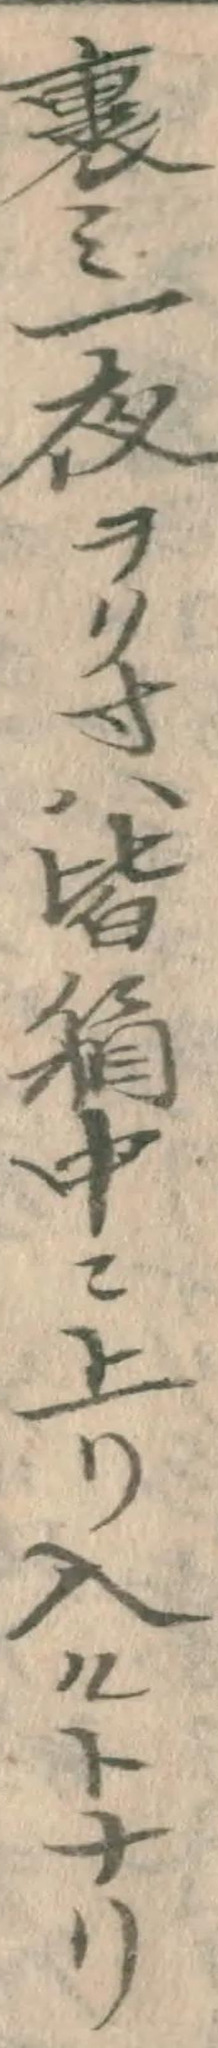裹ミ一夜ヲク時ハ皆箱中ニ上リ入ルトナリ
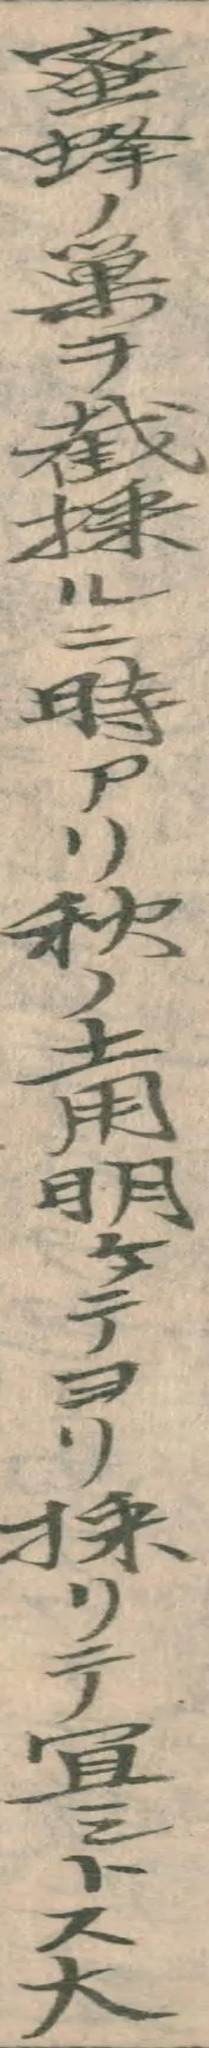蜜蜂ノ巣ヲ截採ルニ時アリ秋ノ土用明ケテヨリ採リテ宜シトス大
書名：千蟲譜 3巻. [1]
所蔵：国立国会図書館 National Diet Library, JAPAN
